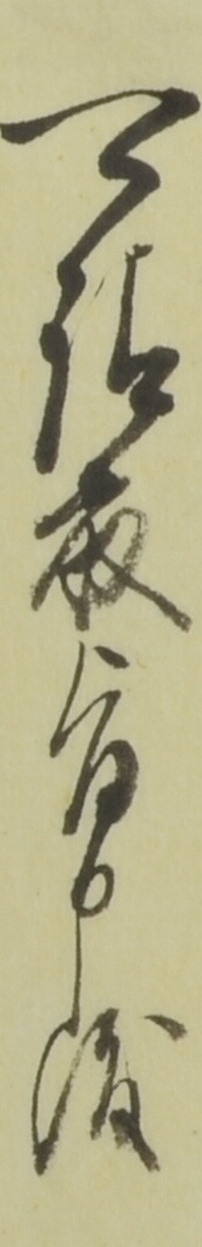可請取旨申渡
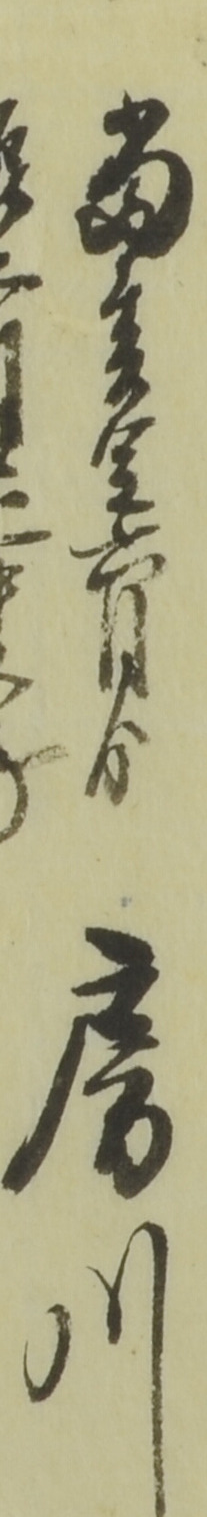当亥年閏六月ゟ房川
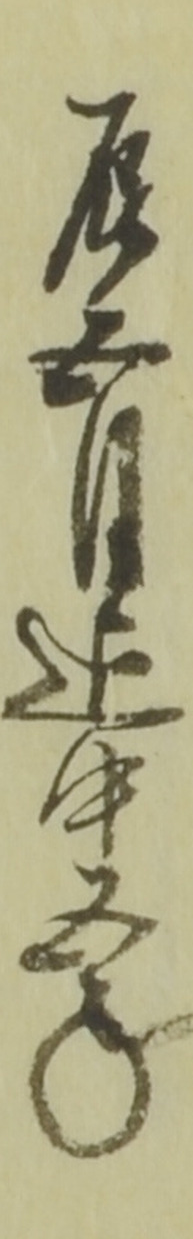辰五月迄中五年
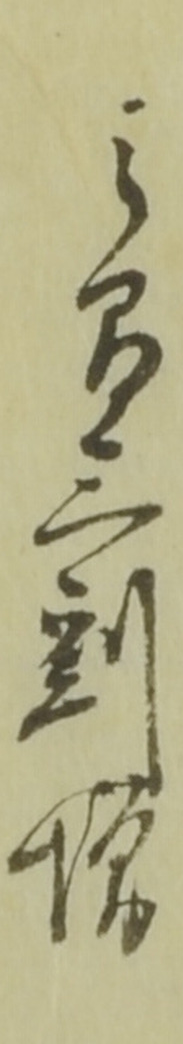之間三割増
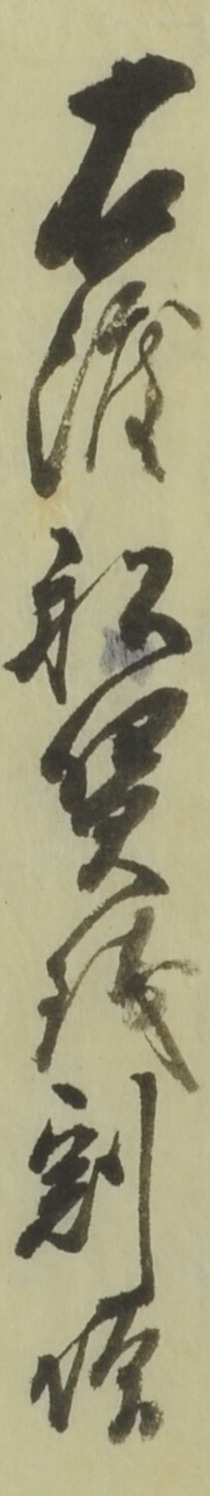右渡船賃銭割増
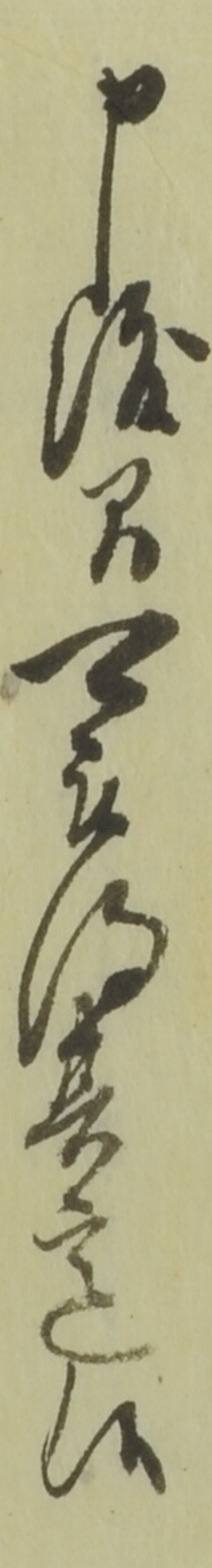申渡間可被得其意候
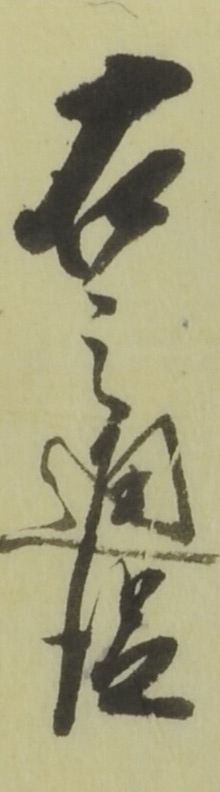右之通従
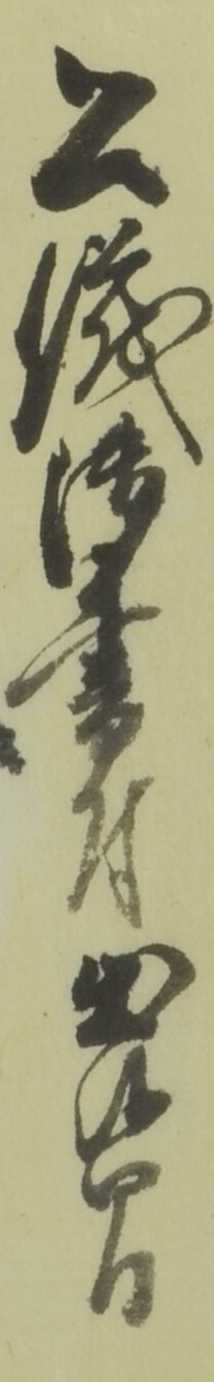公儀御書付出候間
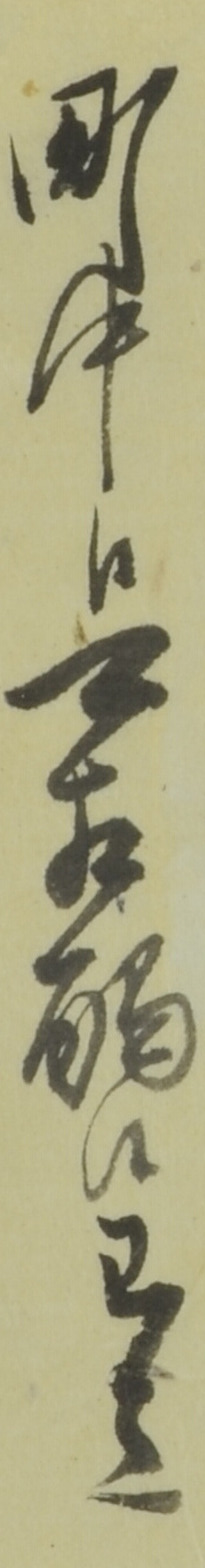町中江可相触候已上
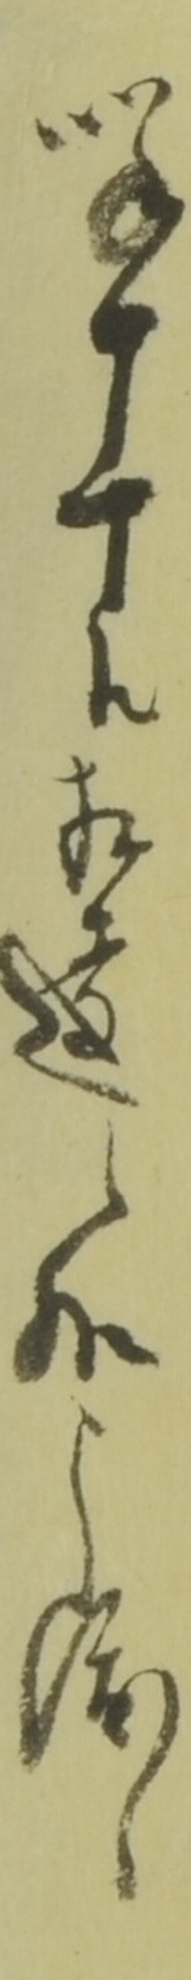呼申丁江相違之外申渡候
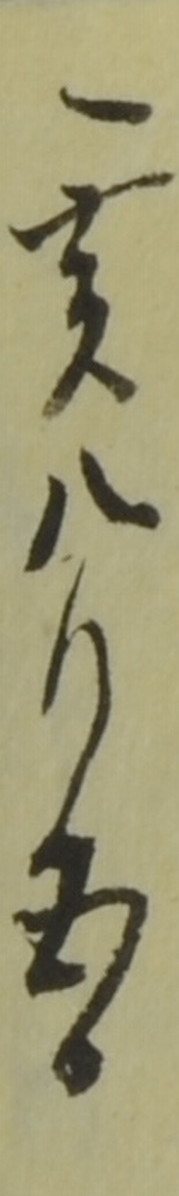亥八月五日

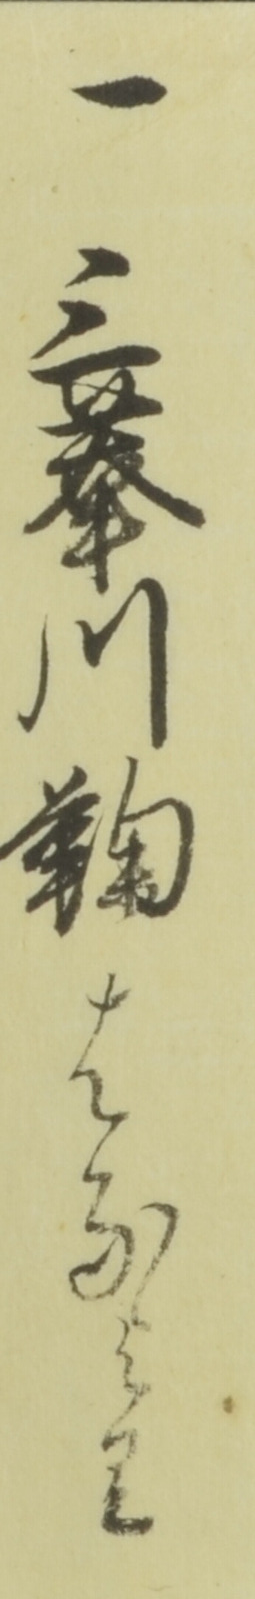一三峯川鞠はなとり
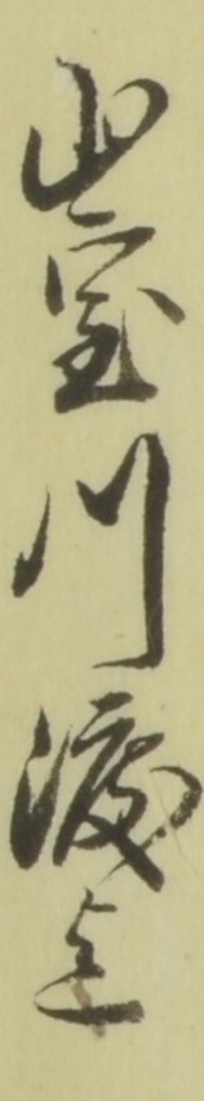山室川渡迄
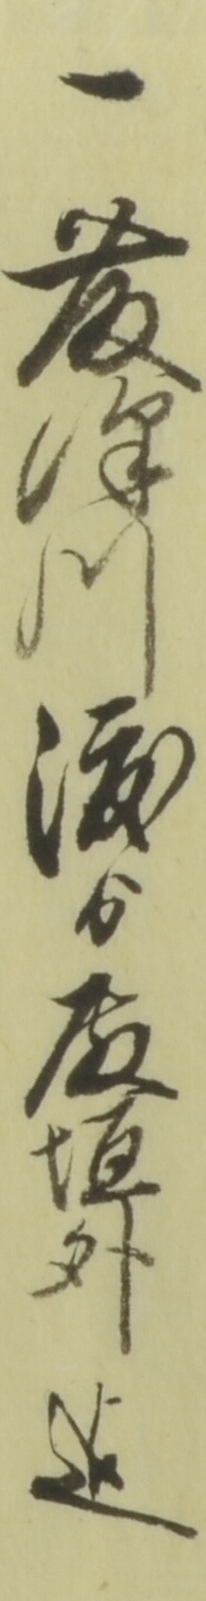一藤沢川渡ゟ殿垣外迄
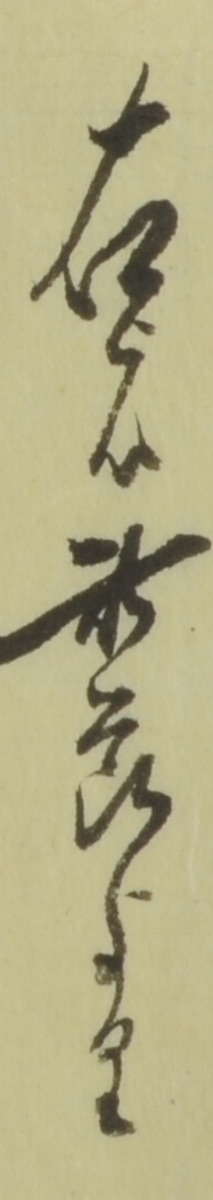右は此節より
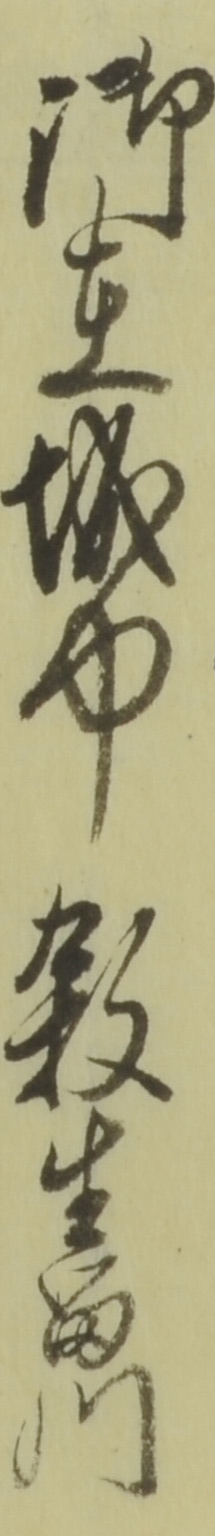御在城中殺生留川
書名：御触書御書附控
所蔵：伊那市立高遠町図書館・合同会社AMANE
